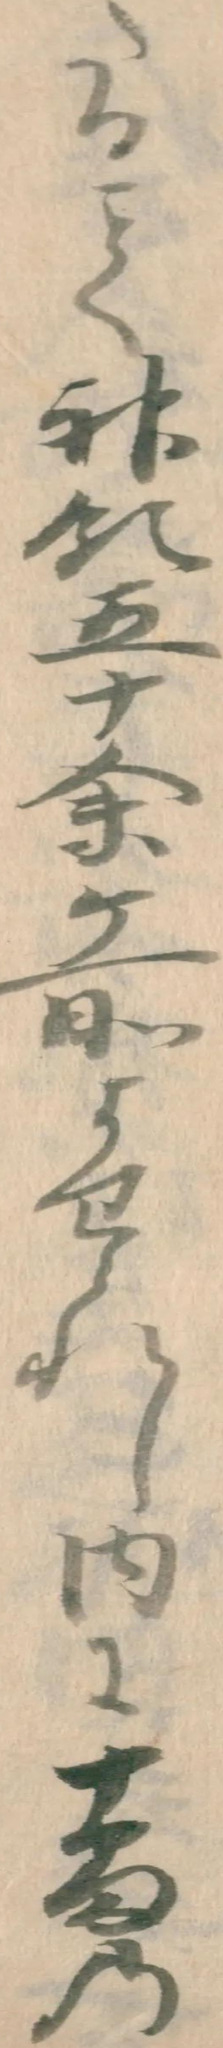たることく神領五十余ケ所よせられし内に十番の
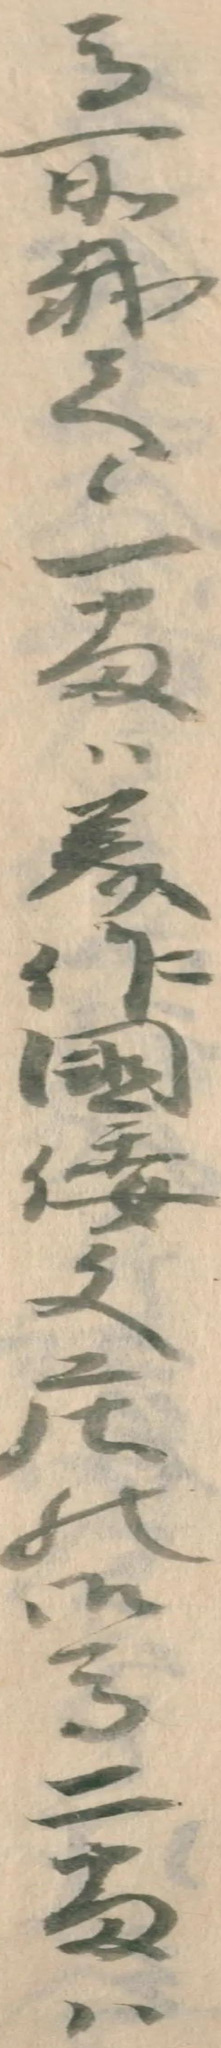馬所載て候一番は美作国倭文庄の御馬二番は
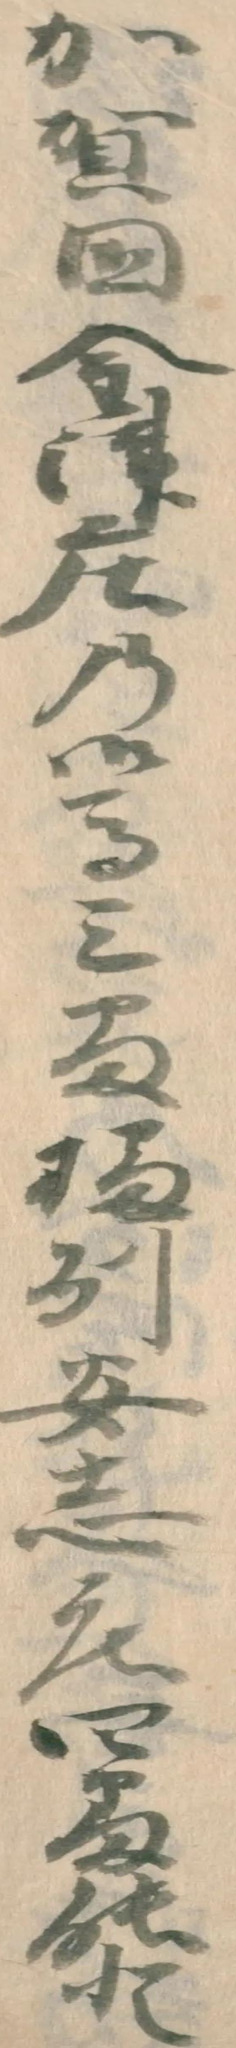加賀国金津庄の御馬三番播州安志庄四番能登
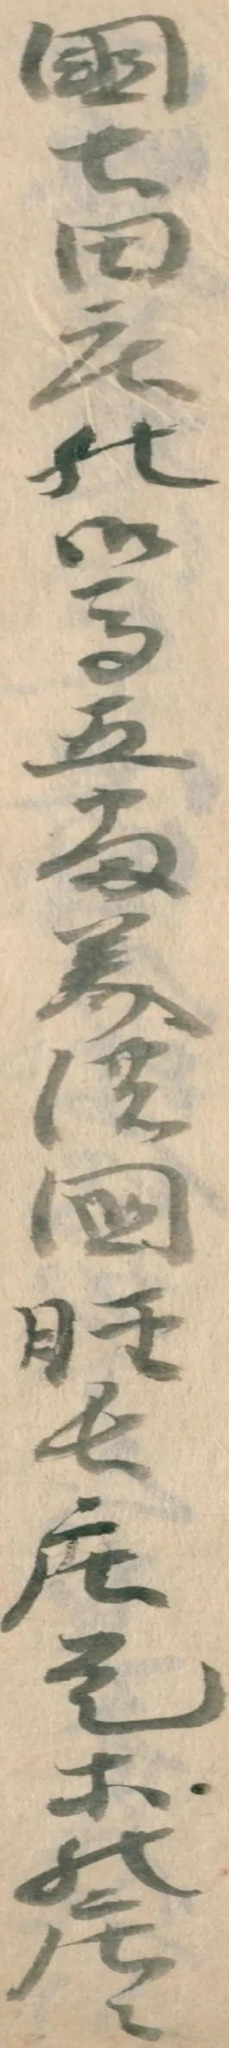国土田庄の御馬五番美濃国脛長庄是等の庄々
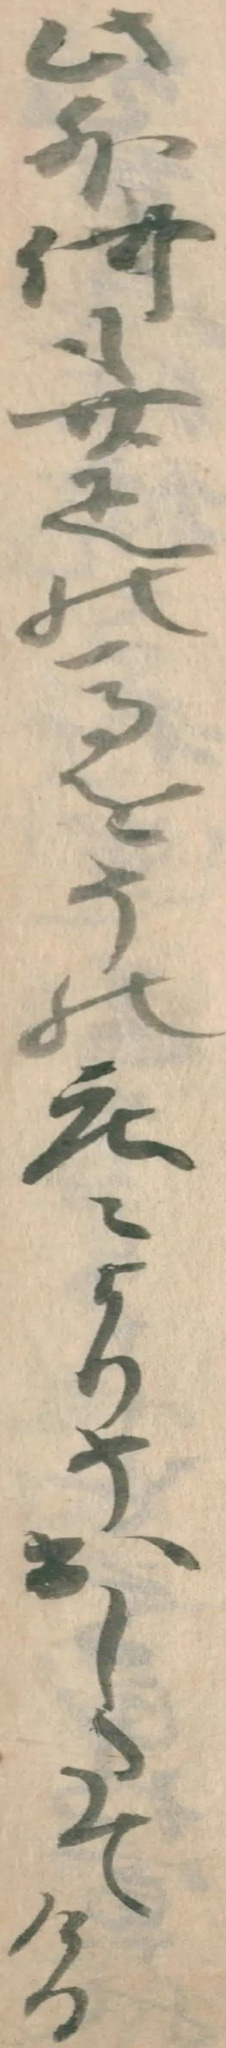此外何も廿疋の馬をその庄々よりそ出したてける

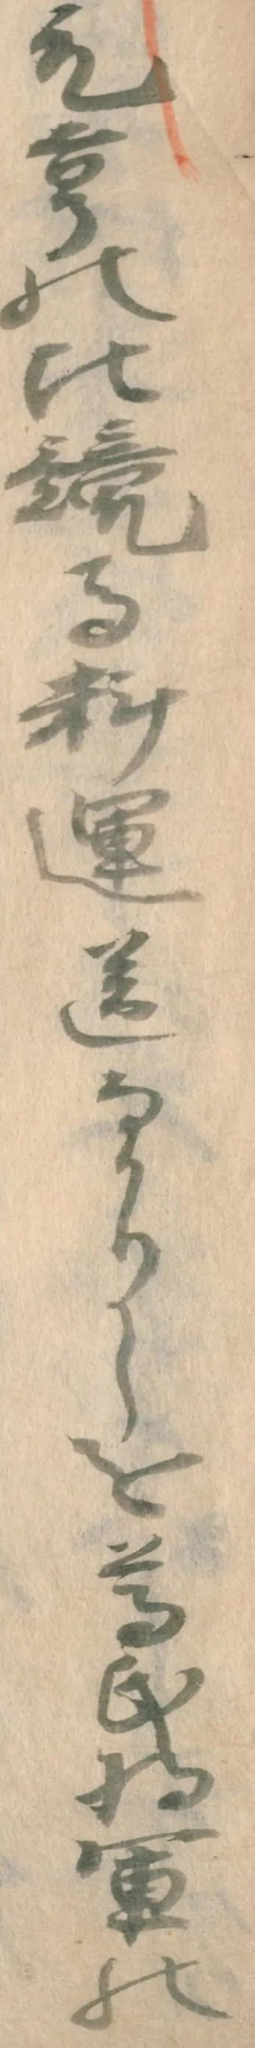元亨の比競馬料運送なかりしを尊氏将軍の
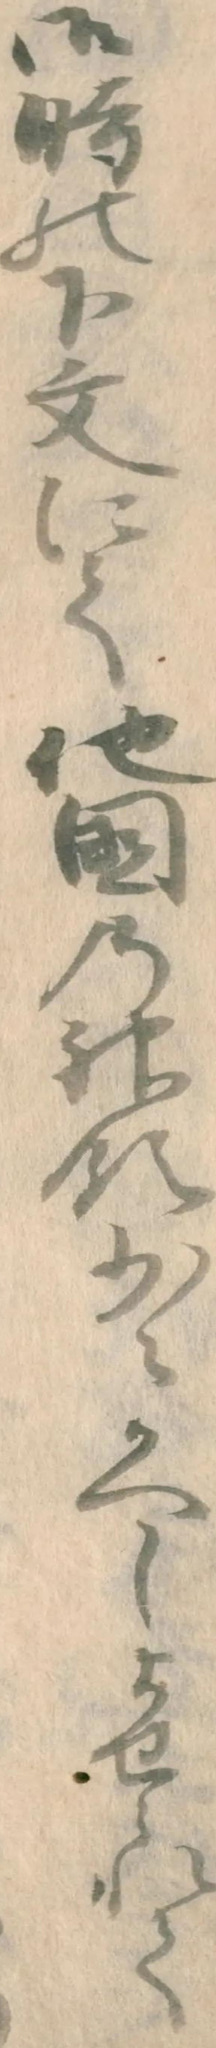御時の下文にて他国の神領少々かへしよせられて
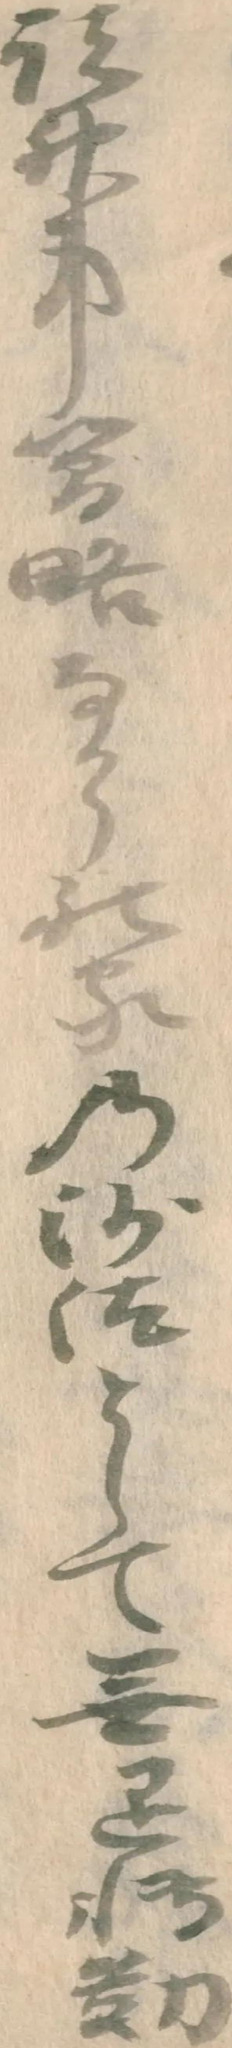諸神事簡略なから社家の沙汰として無退転勤
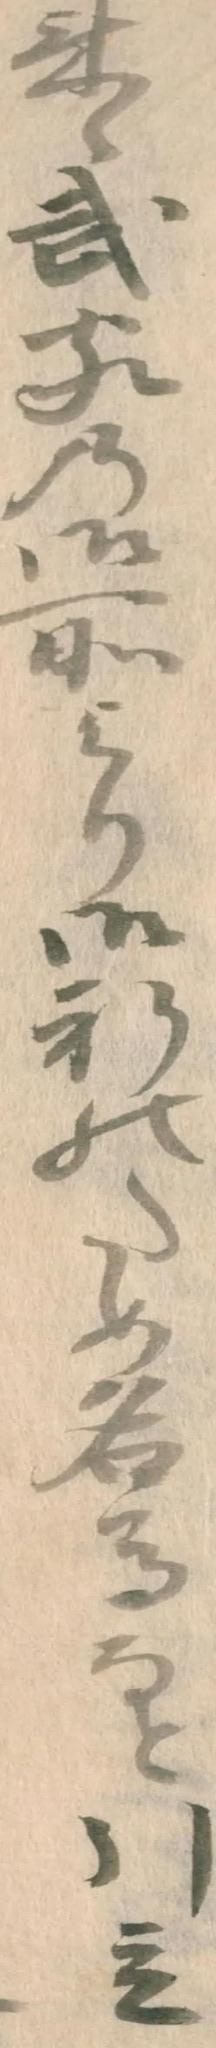来候武家の御所より御祈のため名馬なと引立
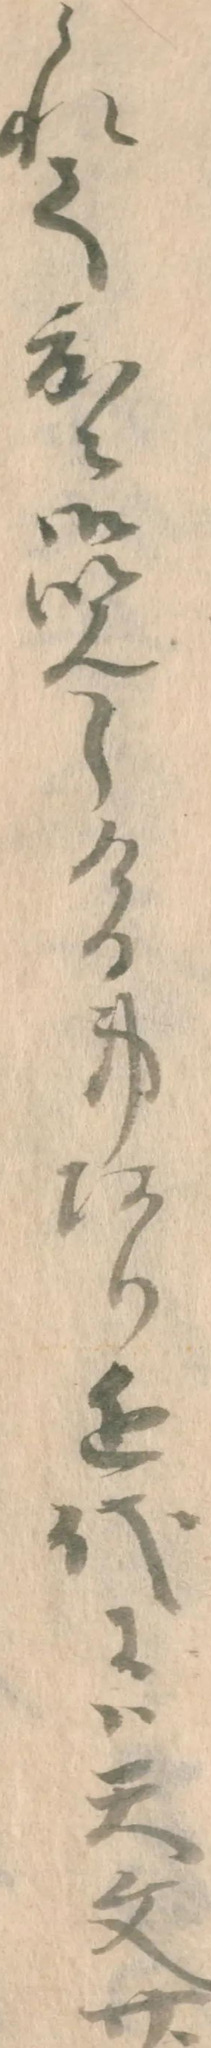られて度々御覧しける事あり近代には天文廿
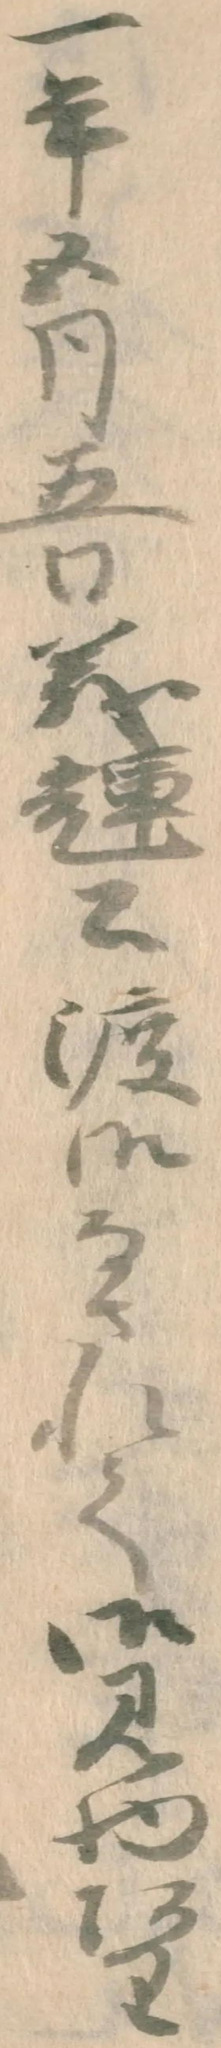一年五月五日義輝公渡御なされて御見物あり
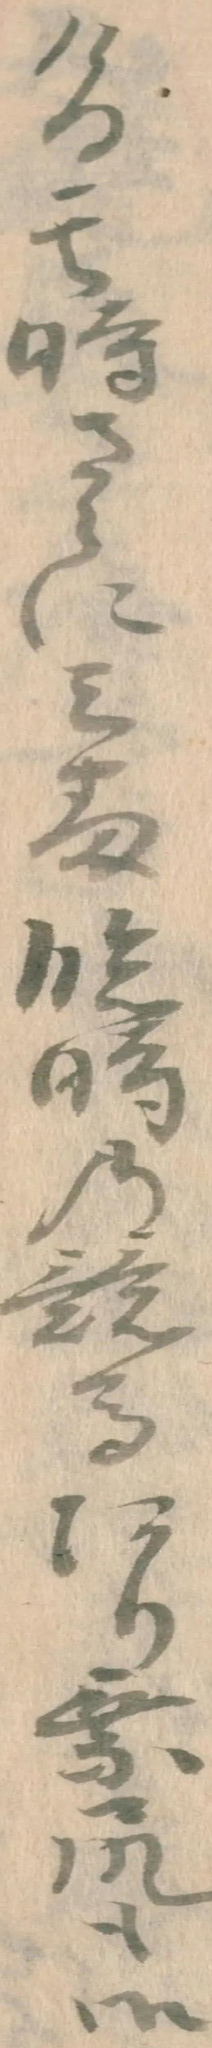ける其時さらに三番臨時の競馬あり乗尻も御
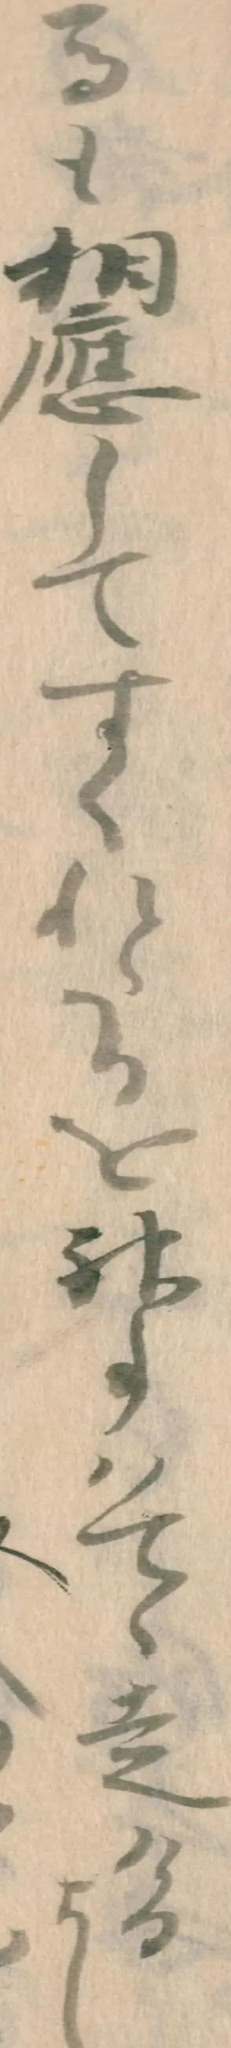馬も相応してすくれたるを神事はてゝ走けるよし
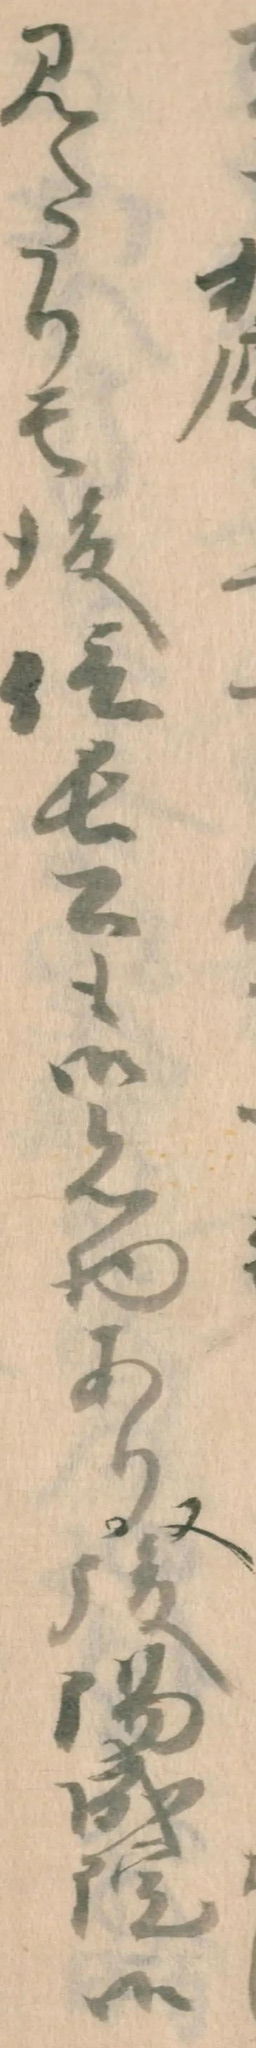見えたり其後信長公も御見物あり◦後陽成院御
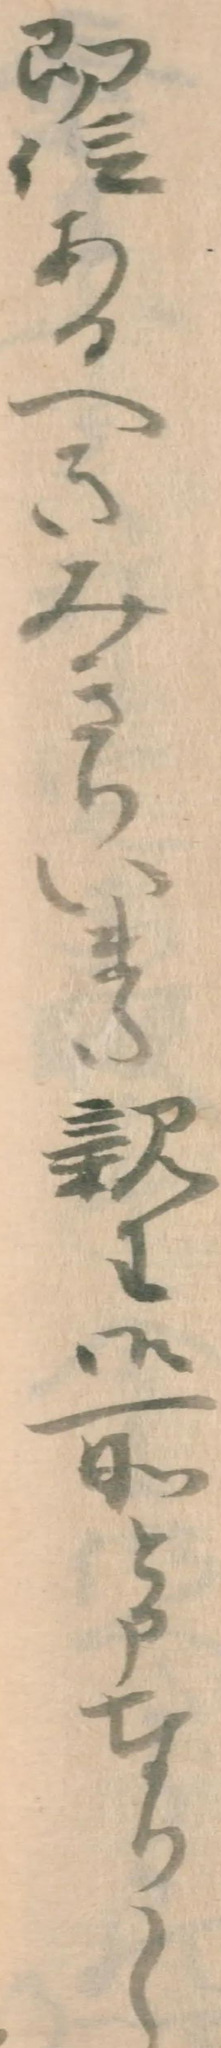即位あるへきみきりいまた親王御所と申奉りし
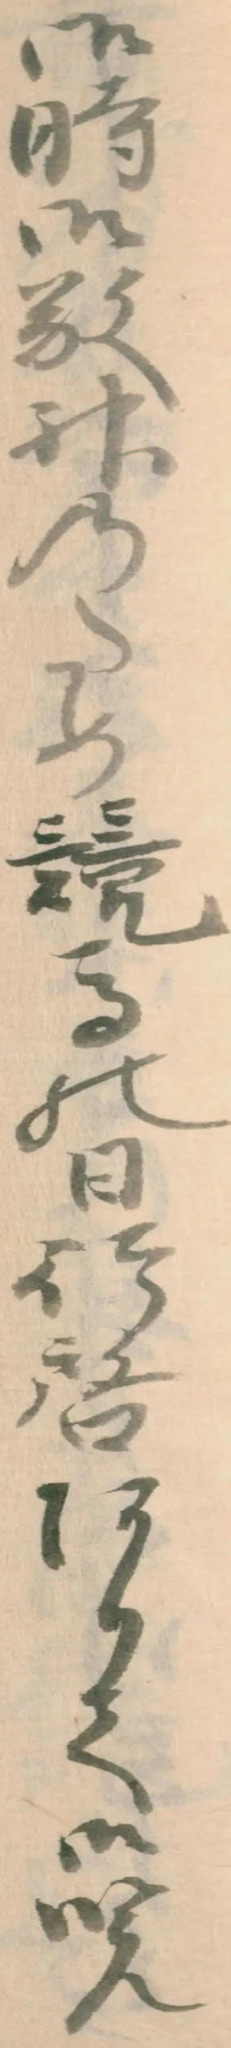御時御敬神のため競馬の日行啓ありて御覧
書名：賀茂社記録. 第1冊
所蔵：国立国会図書館 National Diet Library, JAPAN
